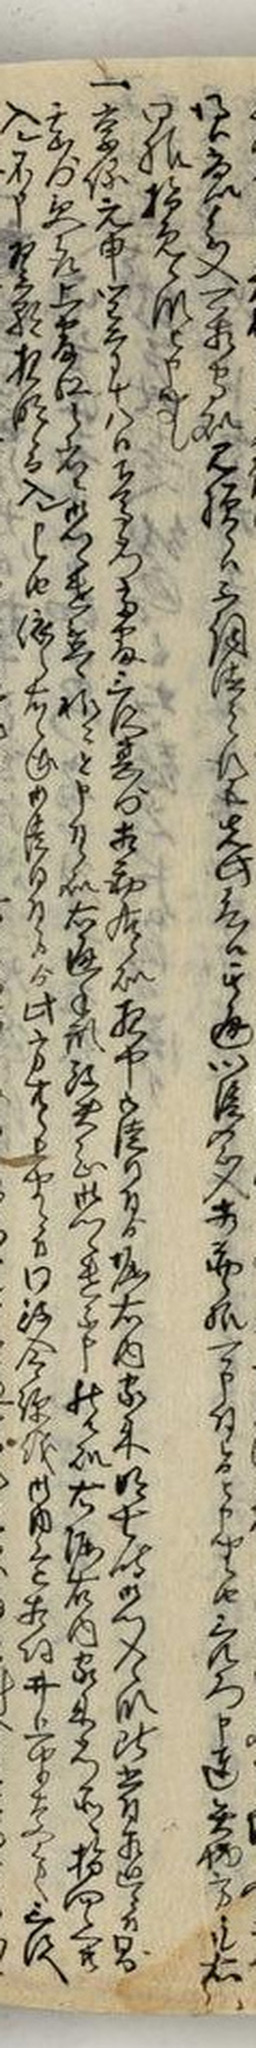一享保元申閏二月十八日下馬御門当番三沢甚右衛門相勤居候処夜中御徒目付ゟ堀右内家来明七時御門入候段断書付相廻候に付則
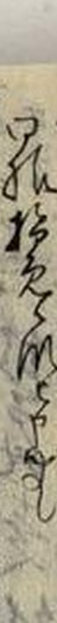同様指免候段被申聞候
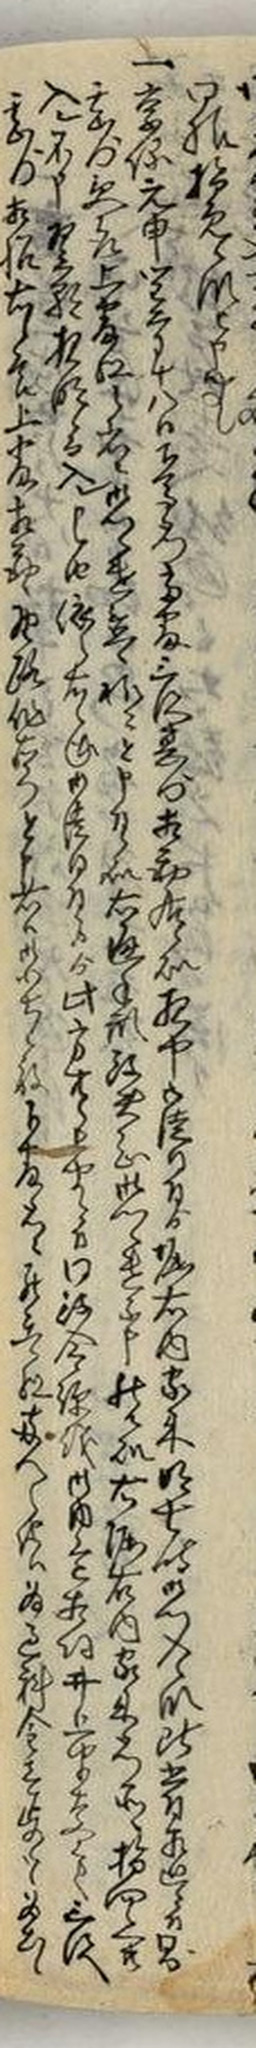甚右衛門受取上番組之者に御門へ遣置候様にと申付候処右通手形致失念御門へ遣不申然る処右堀右内家来御門所へ指向候へ共
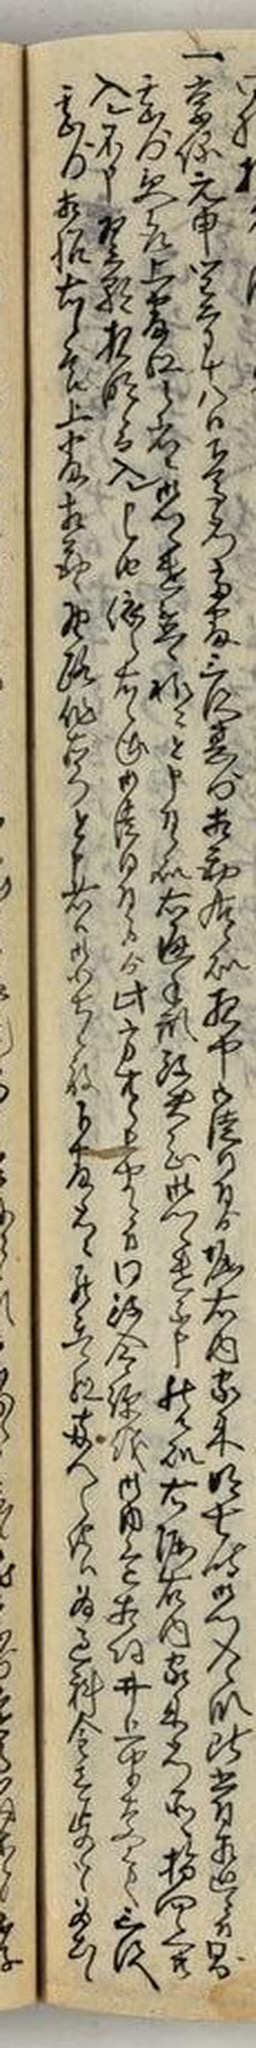入れ不申翌朝夜明候而入れ申候由依之右之趣御徒目付方ゟ此方共申聞候に付同役令評儀御内意相伺井上半太夫方へ三沢
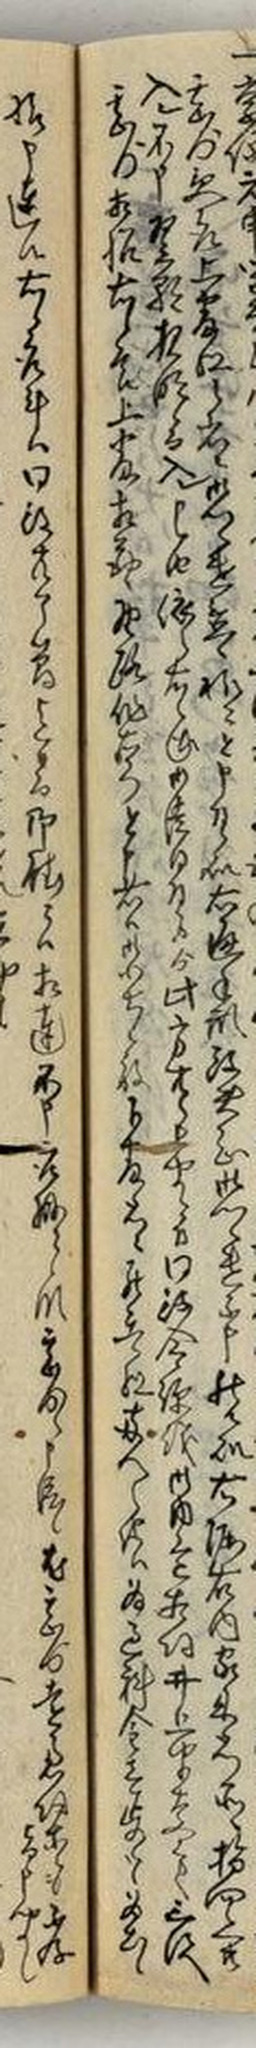甚右衛門相招右之節上番相勤候野路作右衛門と申者は御ふち被放下番御門に罷在候組両人之儀は為過料勤壱歩ツヽ為出之候
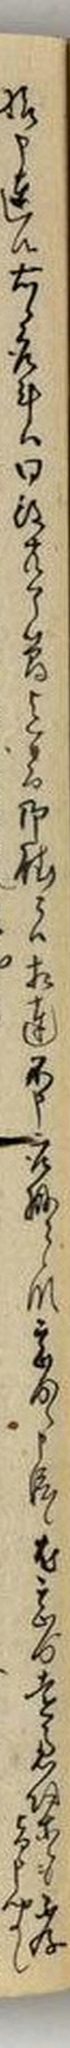様申達候右之取斗は同役共了簡迄に而御聴には相達不申取扱候段甚右衛門へ申渡候尤甚右衛門遠慮伺等にも不及旨申聞候
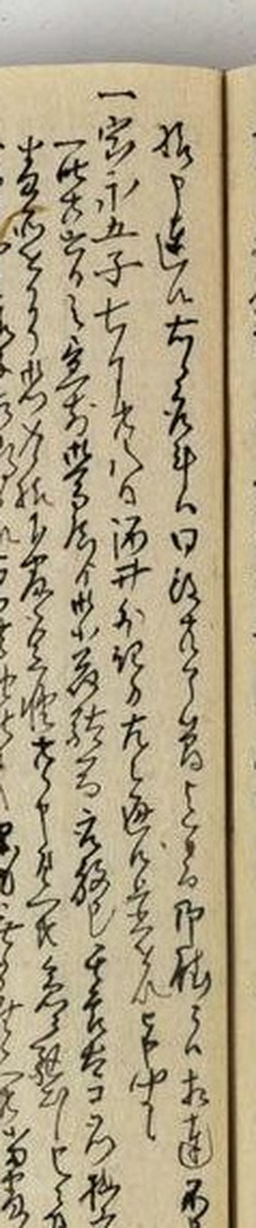一宝永五子七月廿八日酒井外記方左之通口上書を以被申聞候
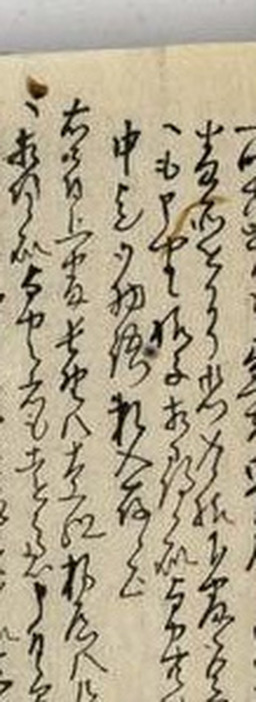中迄御物語頼入存候以上
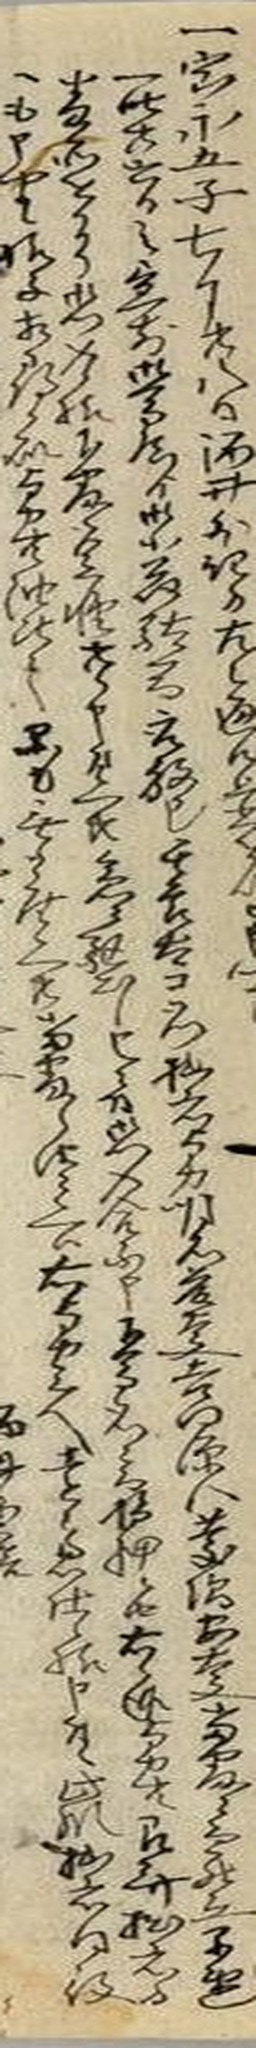へも申聞候様子相尋候処与力共油断之品も無御座候へ共当番之儀に候へは右与力三人遠慮仕候様申付候此段拙者同役
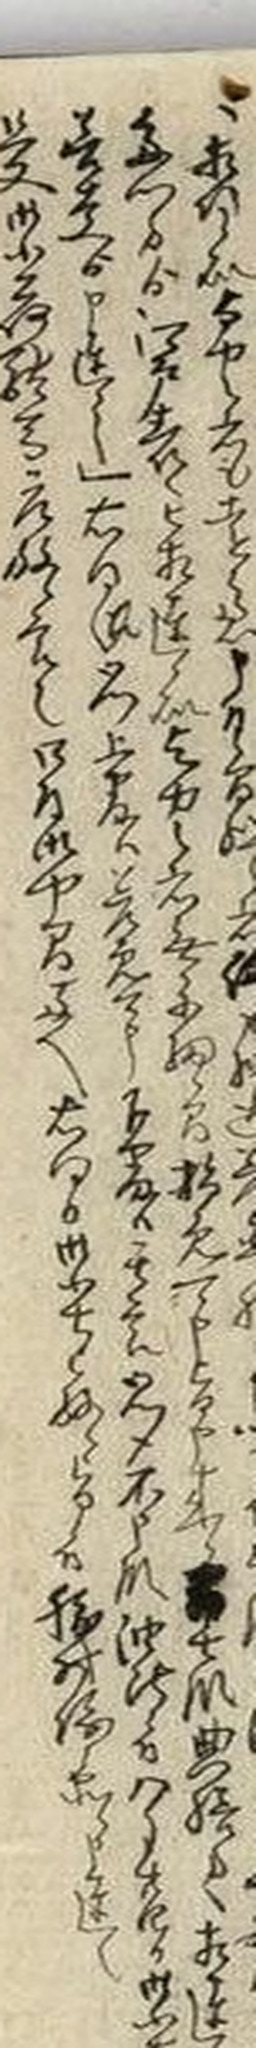且又御小荷駄馬取放候節之口付御中間両人右同日御ふち放候旨に付勝村儀兵衛へ申達候
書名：御門御櫓之部
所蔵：福井県文書館 Fukui Prefectural Archives
